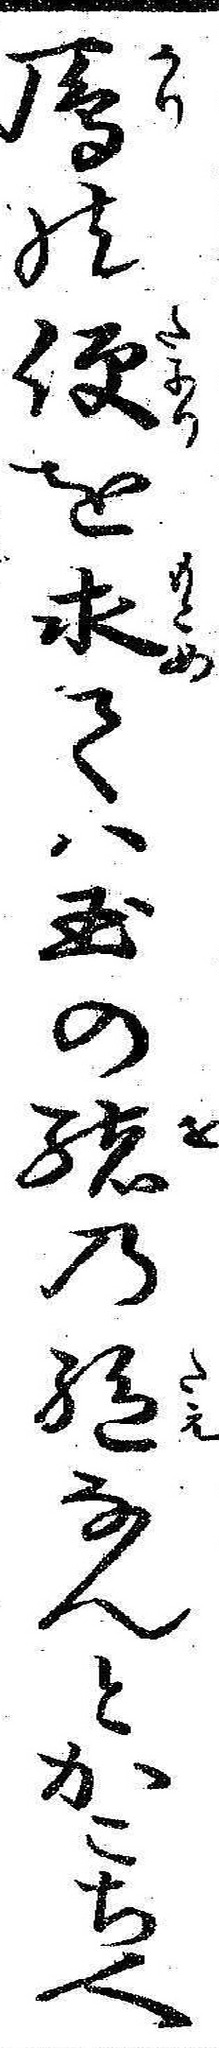雁の便を求ては玉の緒の絶なんとかこち人
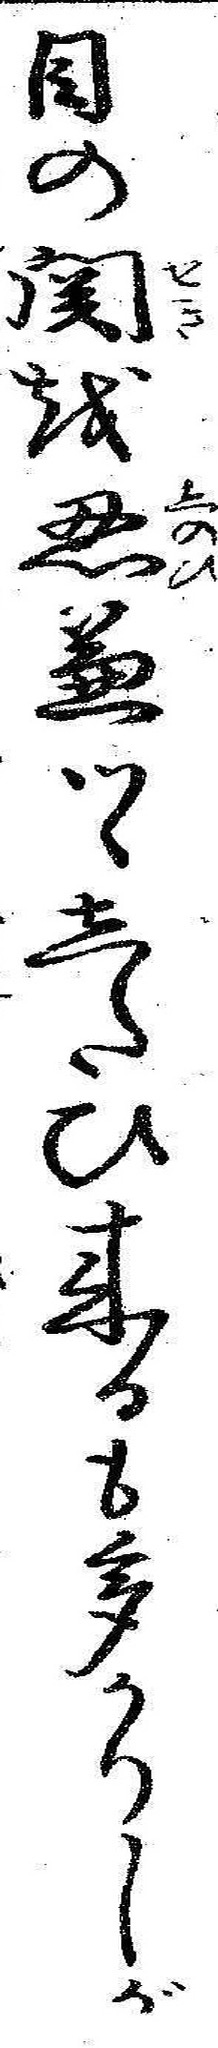目の関を忍兼つゝしたひ来るも多かりしが
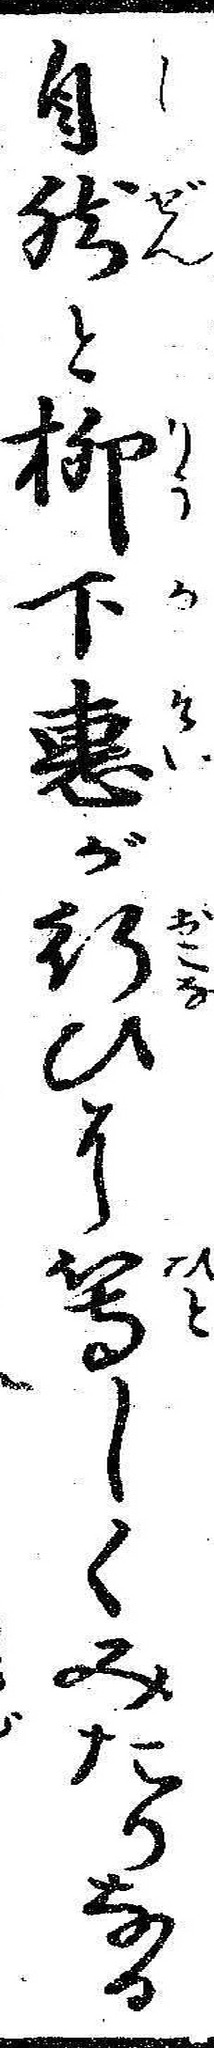自然と柳下恵が行ひに等しくみたりなる
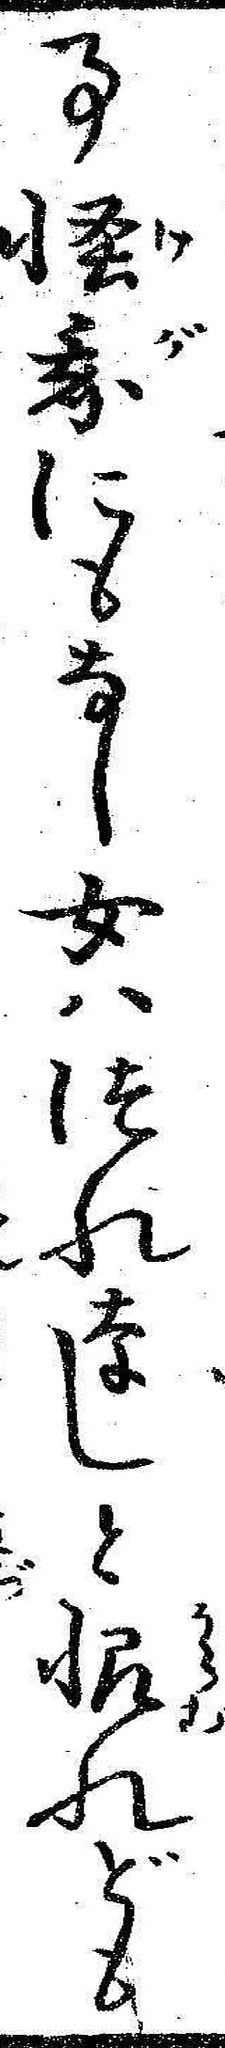事怪我にもなし女はつれなしと恨れども
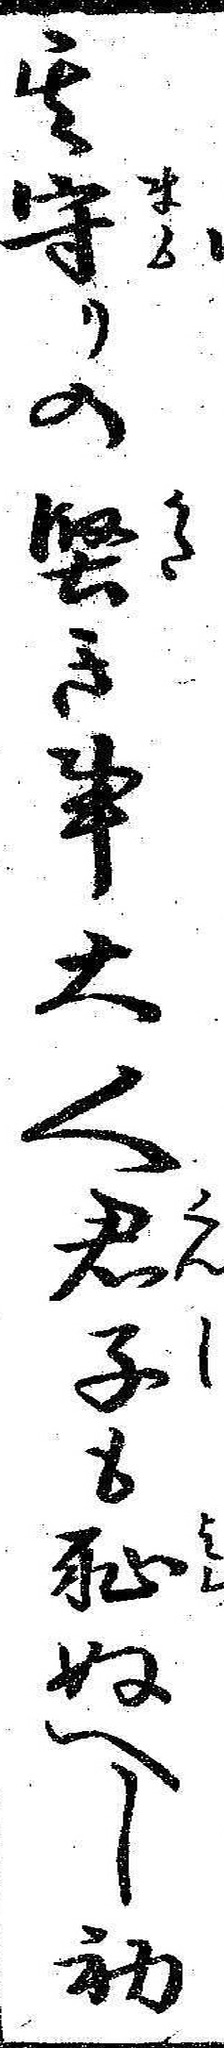其守りの堅き事大人君子も恥ぬへし初
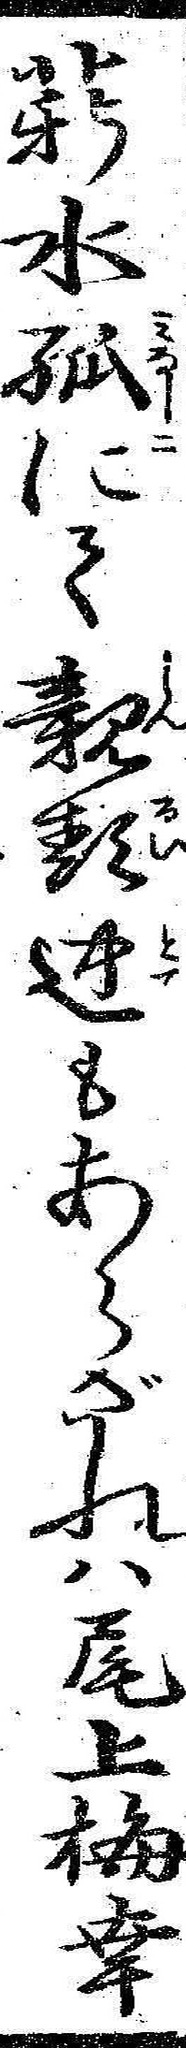薪水孤にて親類迚もあらざれは尾上梅幸
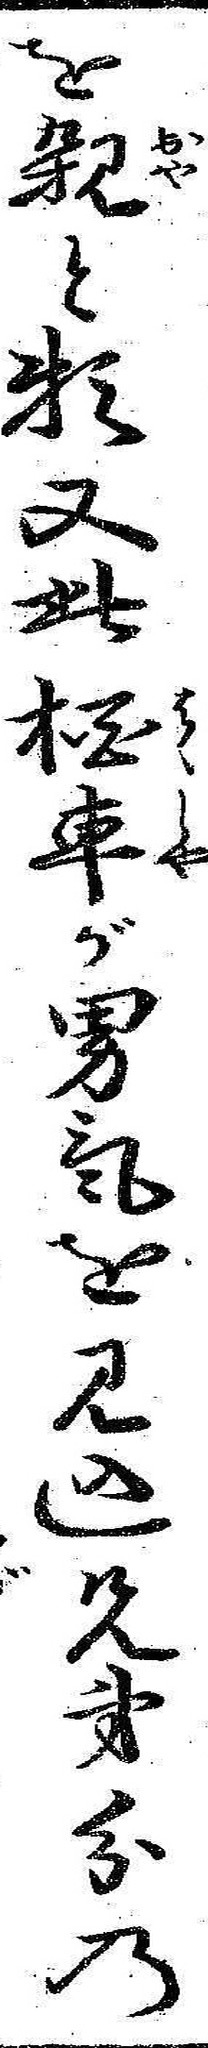を親と頼又此栢車が男気を見込兄弟分の
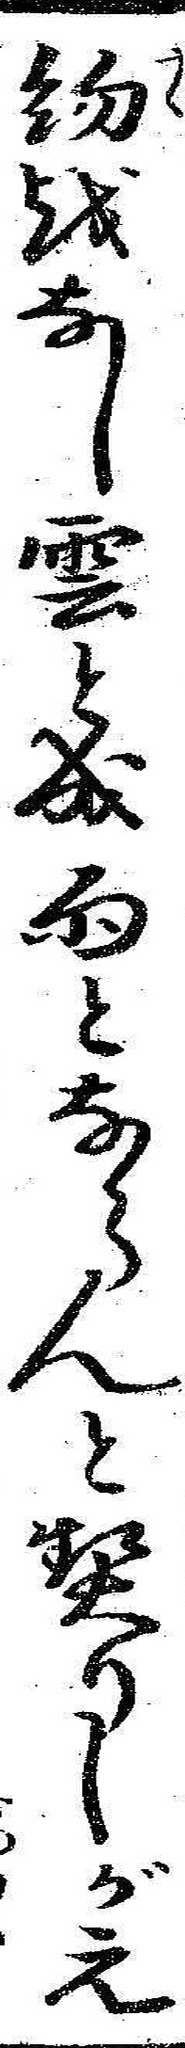約をなし雲と成雨とならんと契りしが元
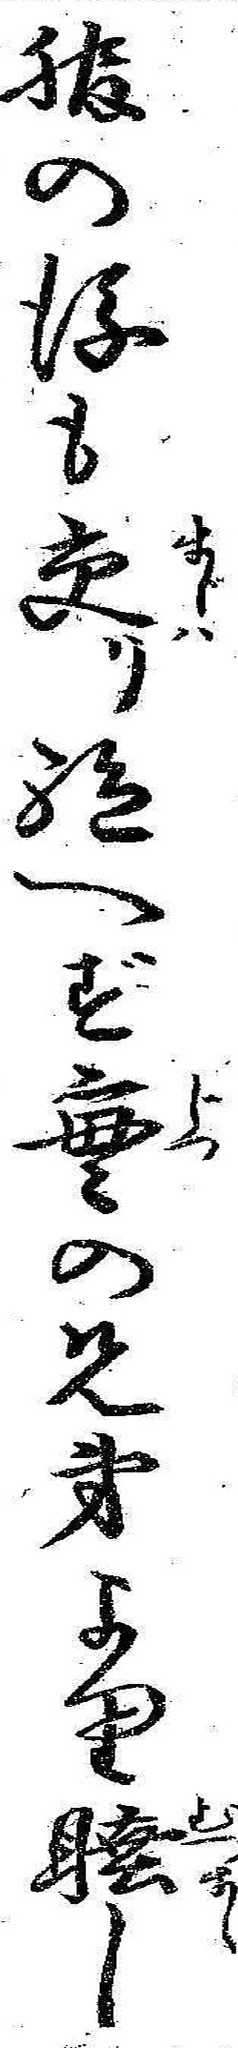服の後も交り絶へず実の兄弟より睦し
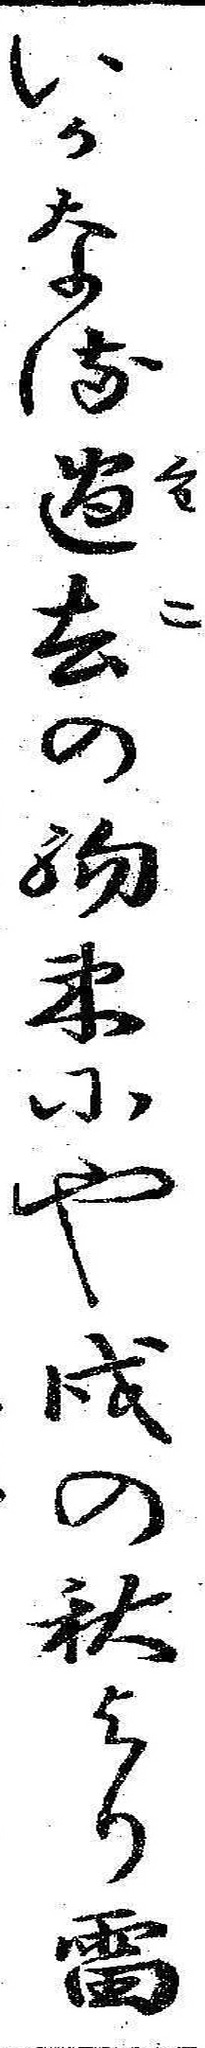いかなる過去の約束にや戌の秋より雷
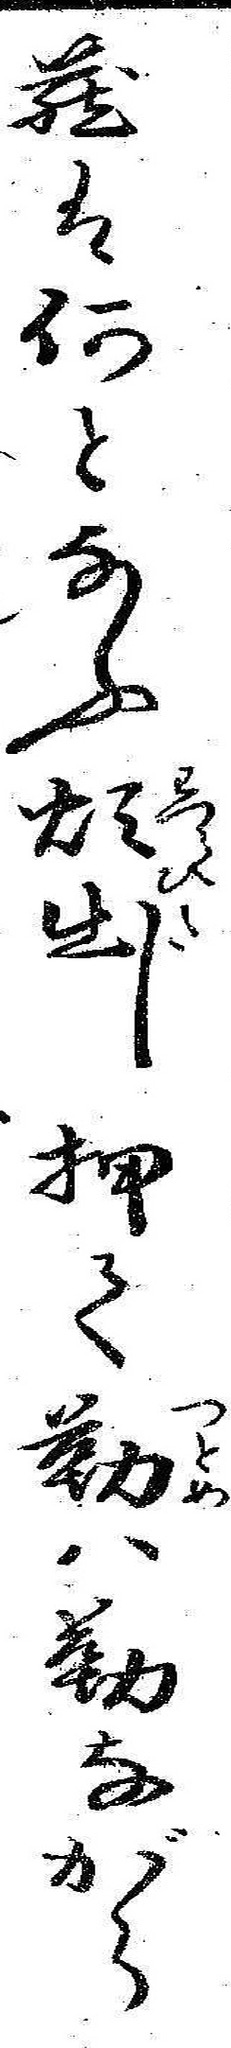蔵は何となふ煩出し押て勤は勤ながら
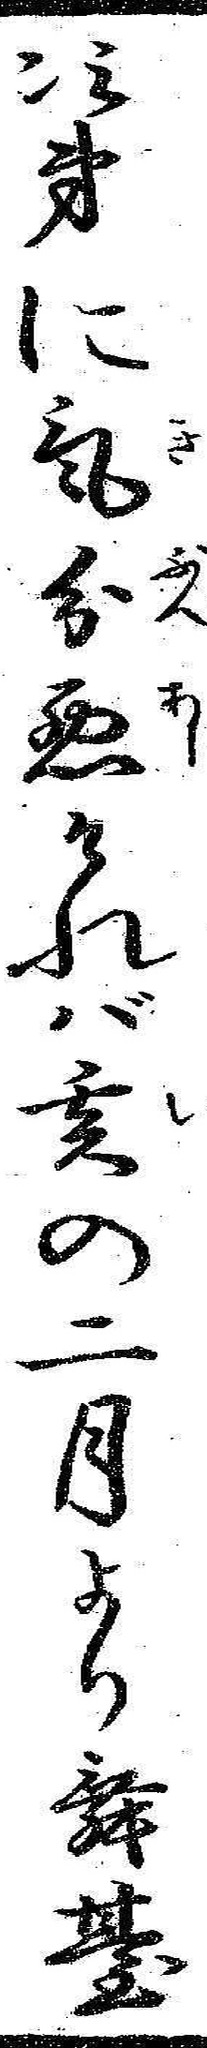次第に気分悪ければ亥の二月より舞台
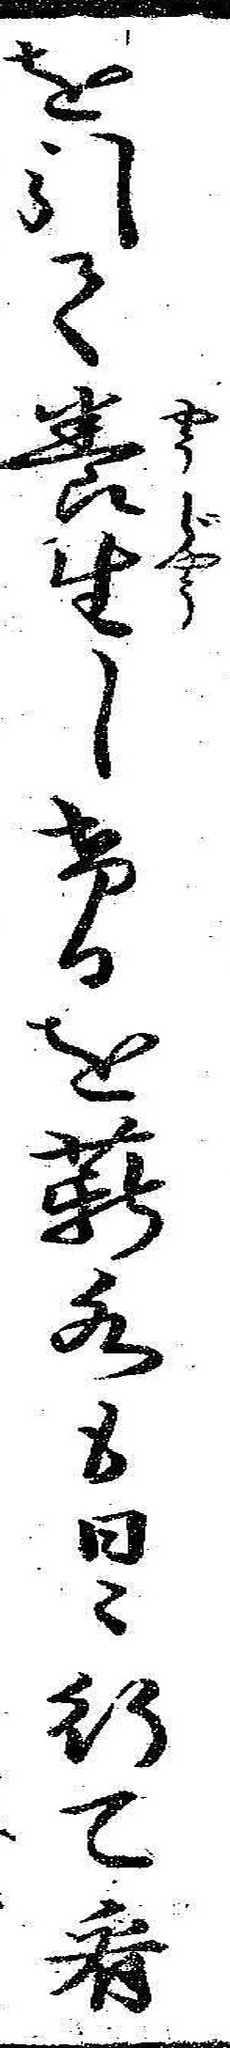を引て養生しけるを薪水も日々行て看
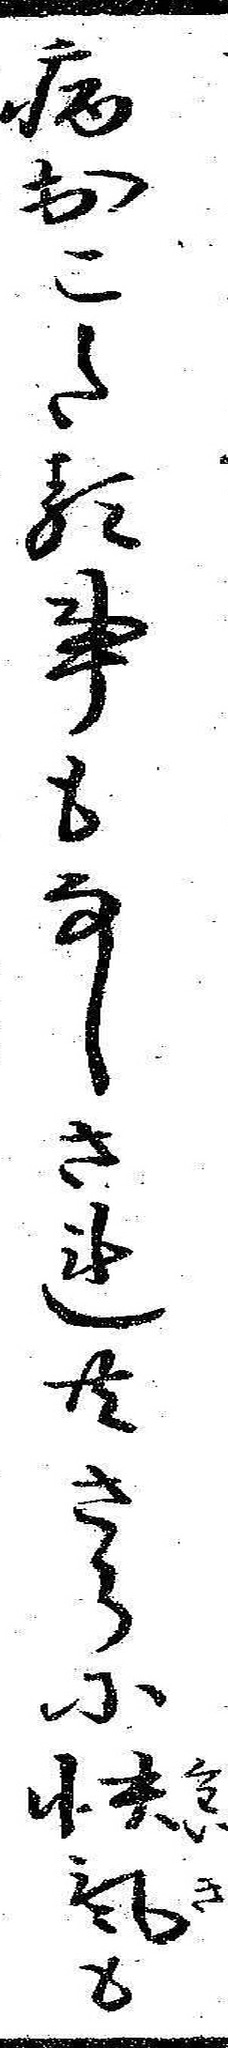病おこたる事もなしされ共さらに快気も
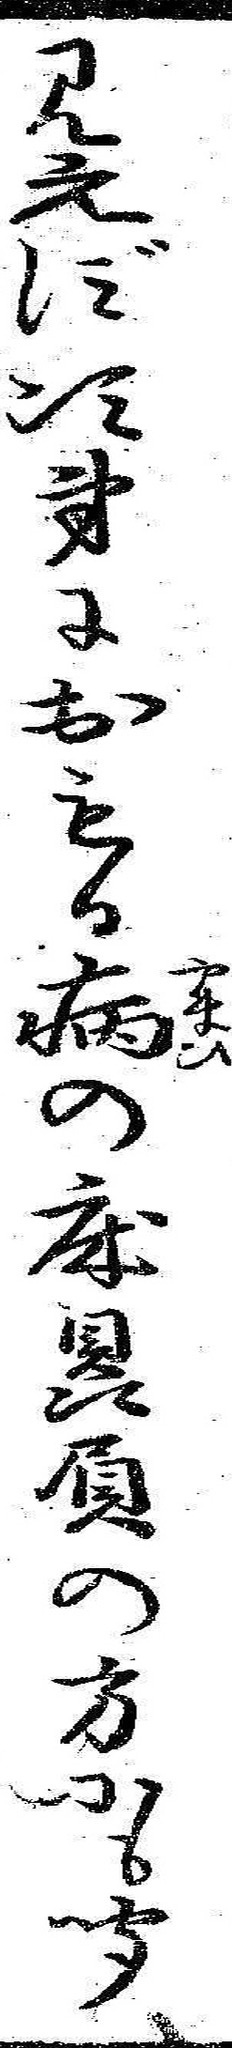見えず次第におもる病の床贔屓の方にも聞

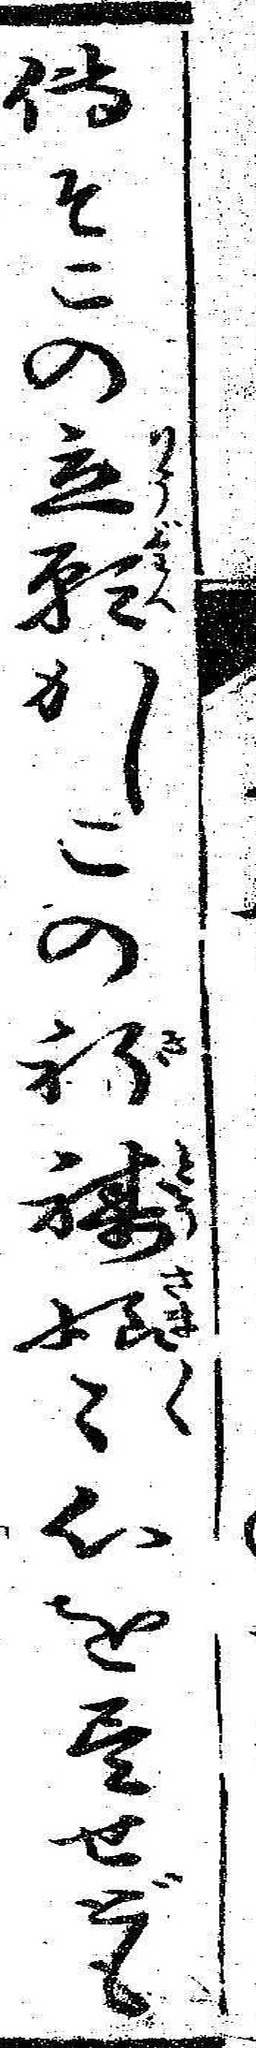伝そこの立願かしこの祈祷様々心を尽せども
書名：根無草後編
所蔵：国文学研究資料館
